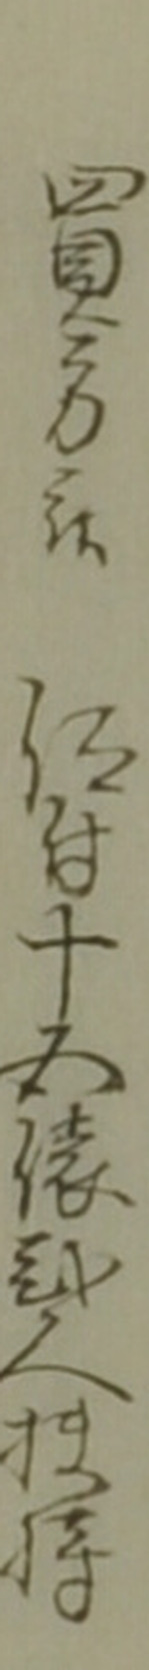買方被仰付十五俵弐人扶持
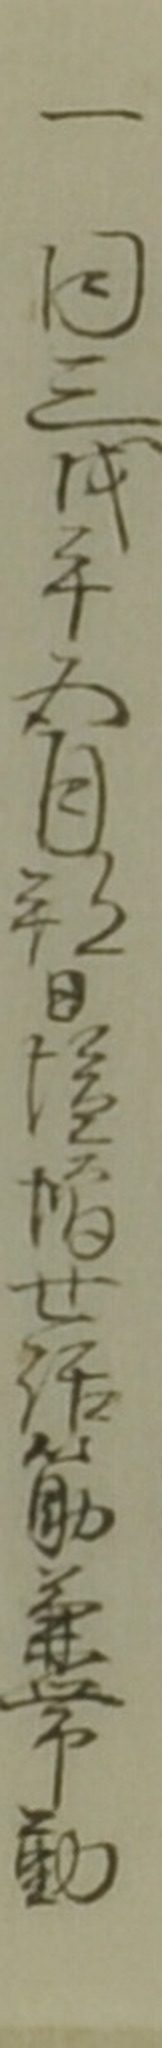一同三戊午五月朔日塩噌世話筋兼帯勤
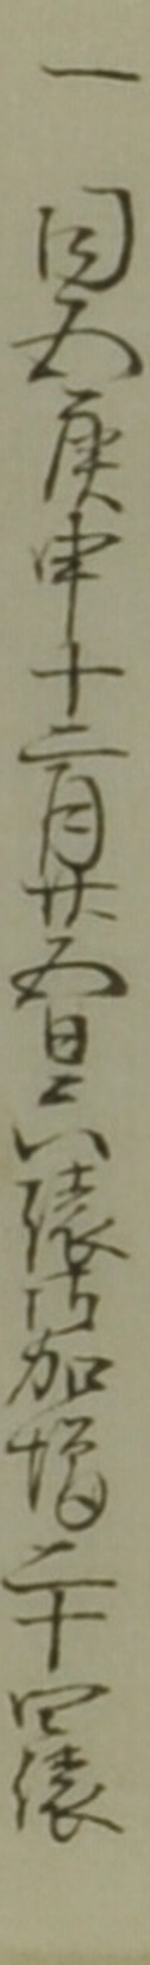一同五庚申十二月廿五日六俵御加増二十四俵
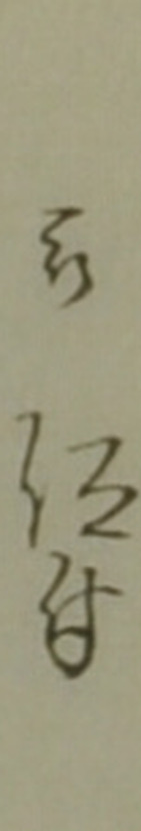被仰付
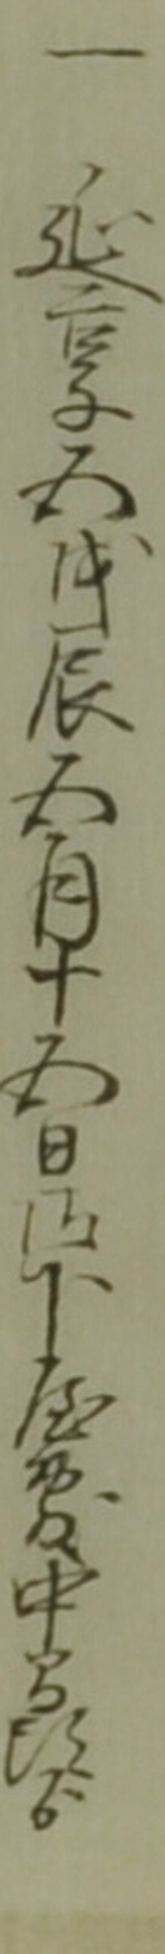一延享五戊辰五月十五日御下屋敷中間頭ゟ
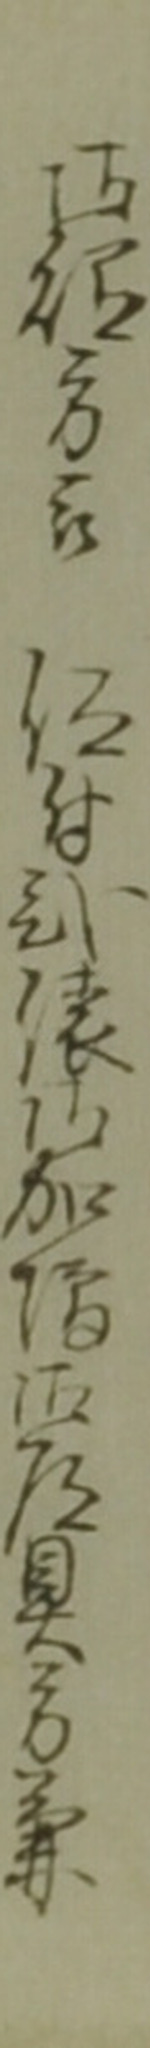御賄方被仰付弐俵御加増御道具方兼
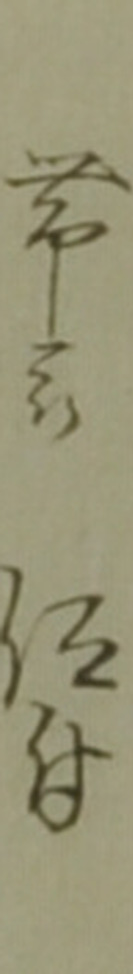帯被仰付
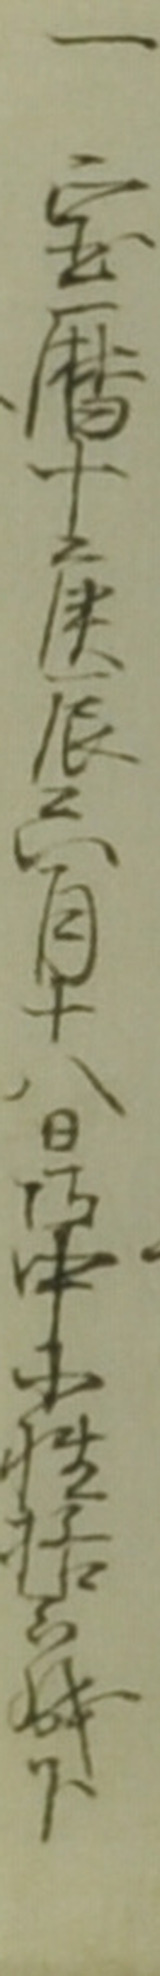一宝暦十庚辰六月十八日御中小性格被成下
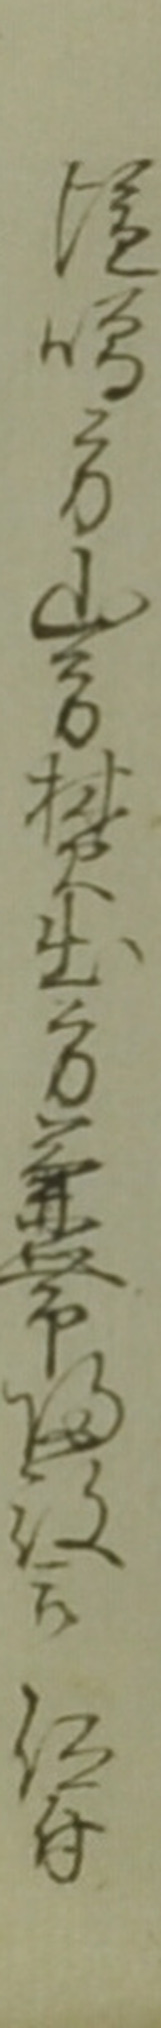塩噌方山方焚出方兼帯帰役被仰付
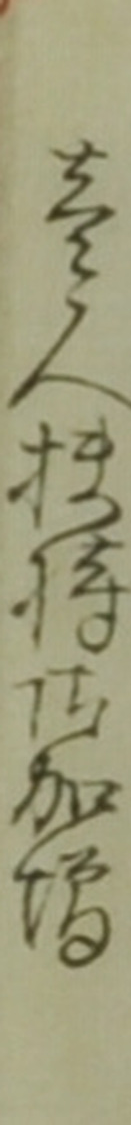壱人扶持御加増
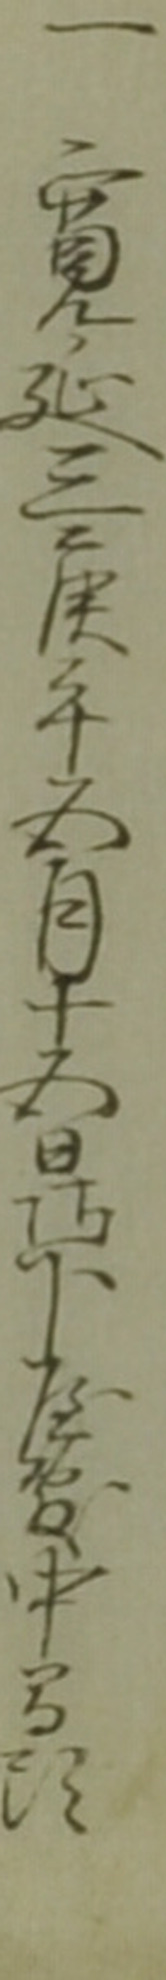一寛延三庚午五月十五日御下屋敷中間頭

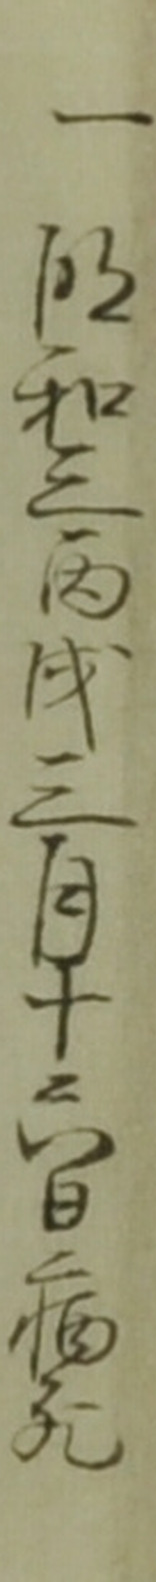一明和三丙戌三月十六日病死
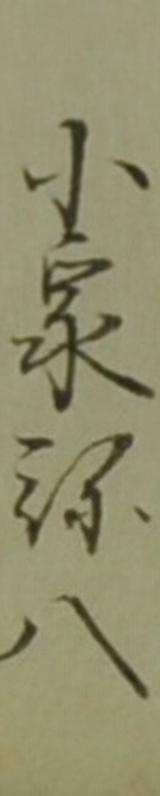小泉弥八
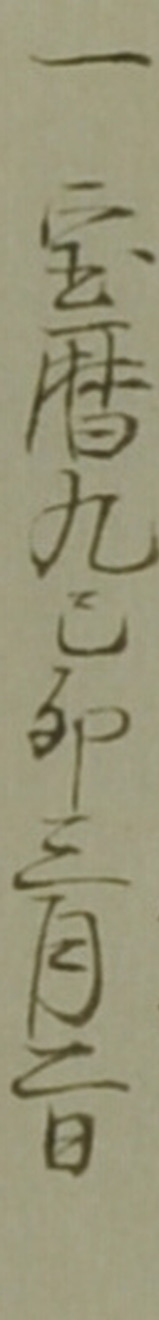一宝暦九己卯三月二日
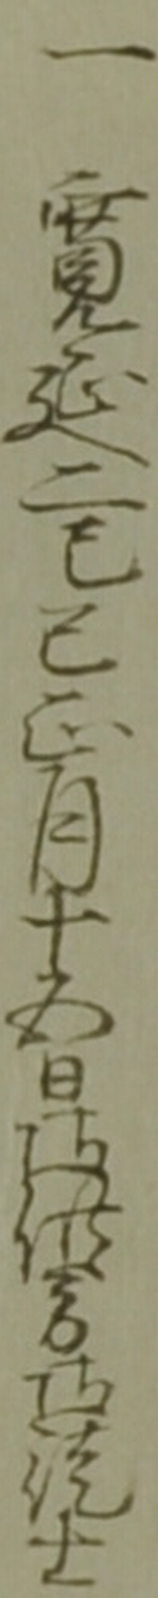一寛延二己巳正月十五日御供方御徒士被
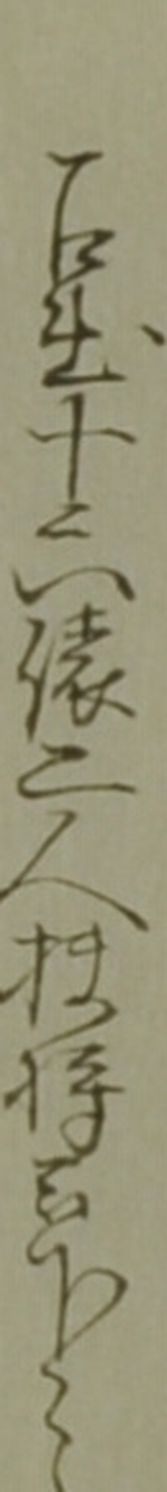召出十六俵二人扶持被下之
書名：無足諸士勤仕録（一）
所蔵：伊那市立高遠町図書館・合同会社AMANE
